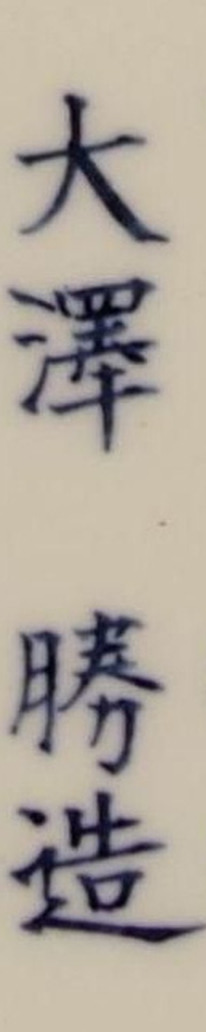大澤勝造
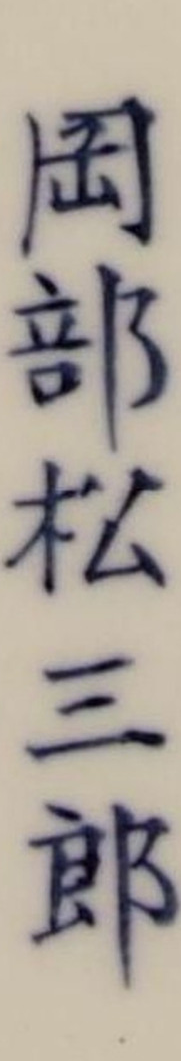岡部松三郎
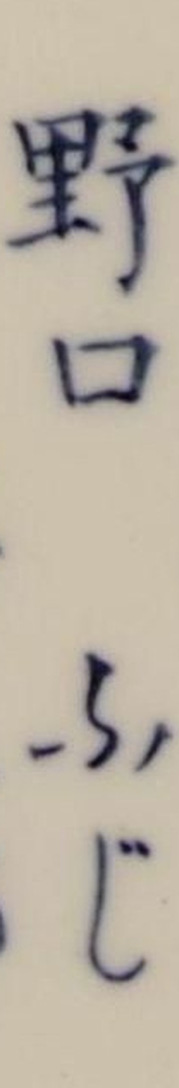野口ふじ
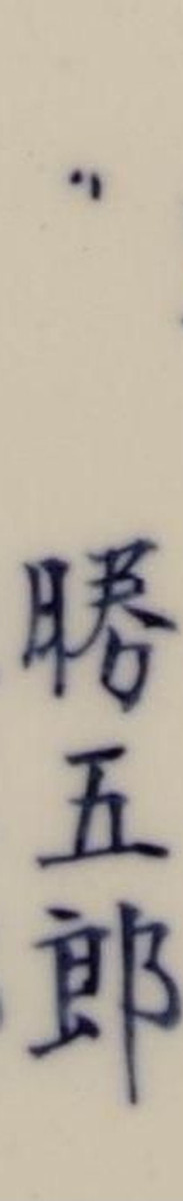勝五郎
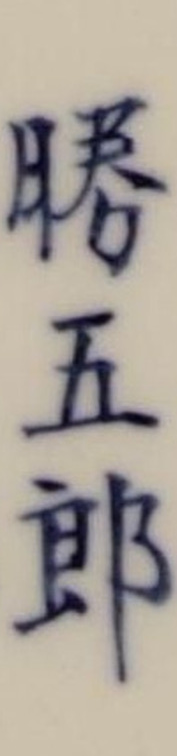勝五郎
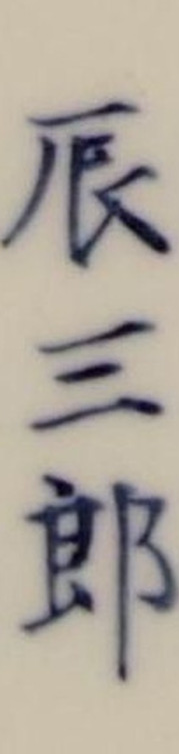時三郎
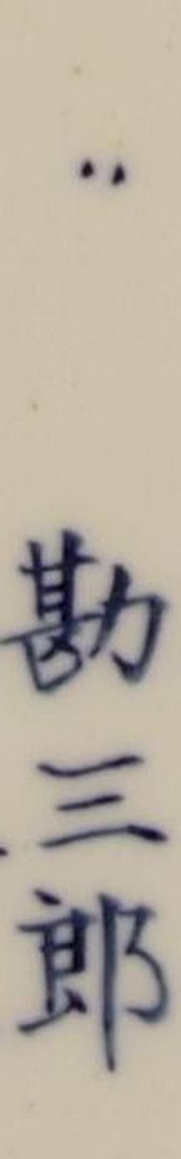勘三郎
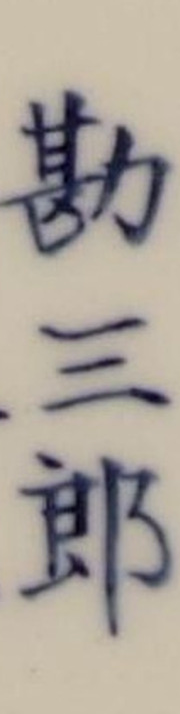勘三郎
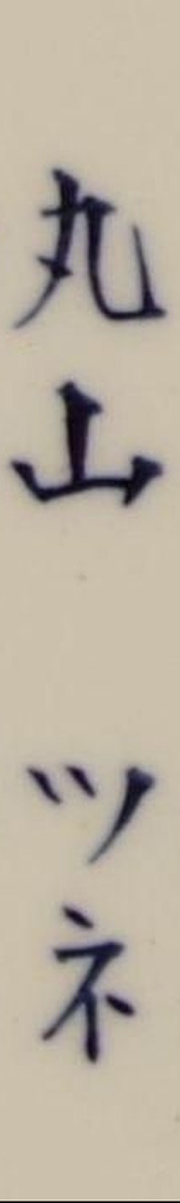丸山ツネ

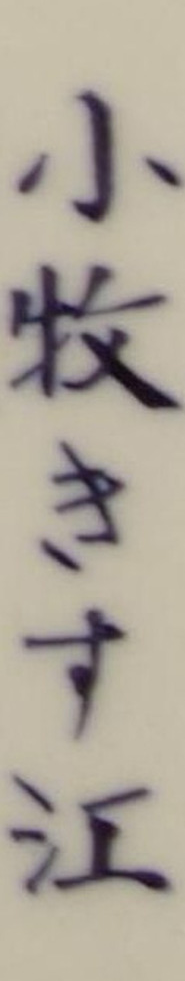小牧きす江
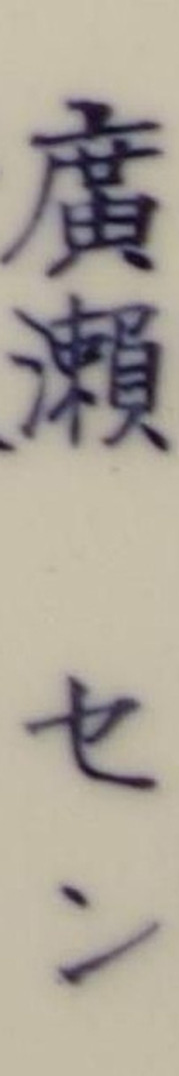廣瀬セン
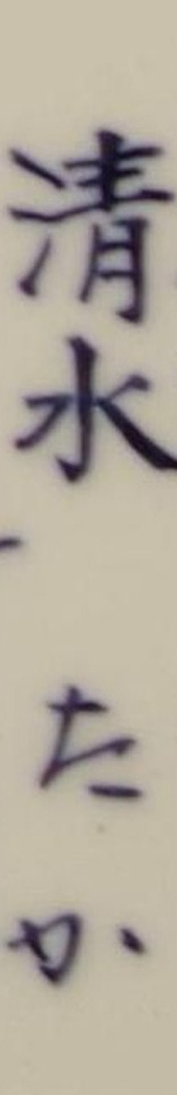清水たか
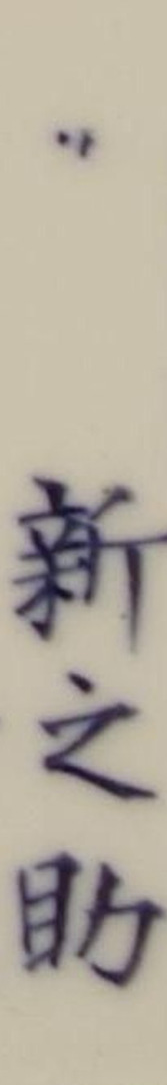新之助
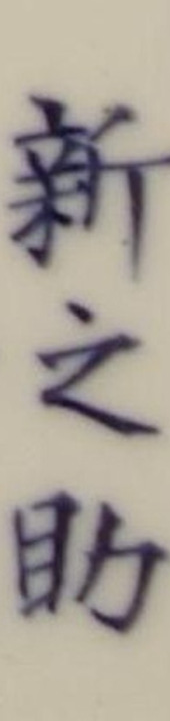新之助
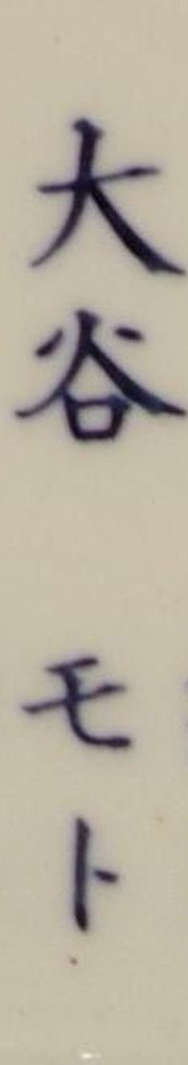大谷モト
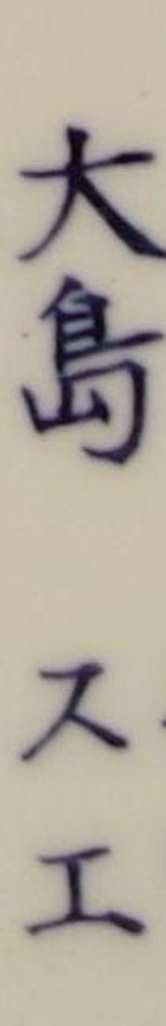大島ス工
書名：E~L
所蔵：高野山金剛峯寺
